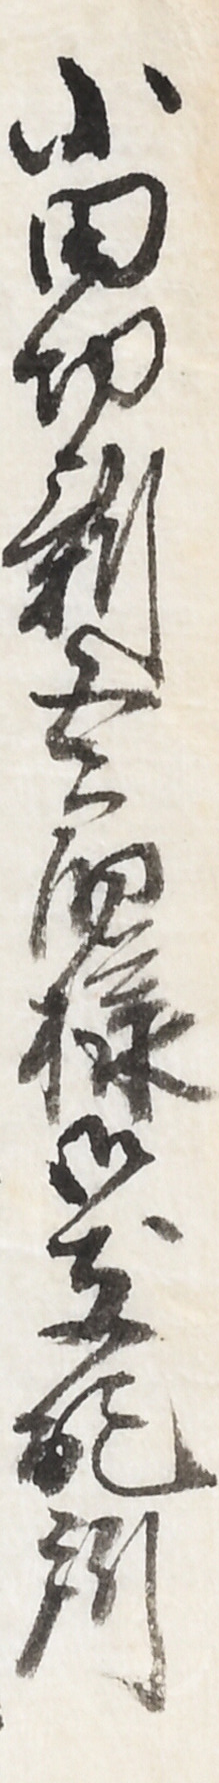小田切新五郎様御支配所
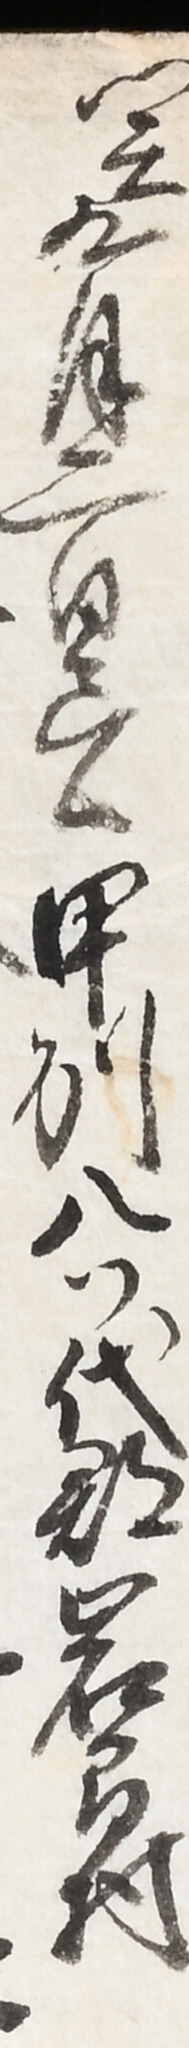閏九月二日着甲州八ツ代郡岩間村
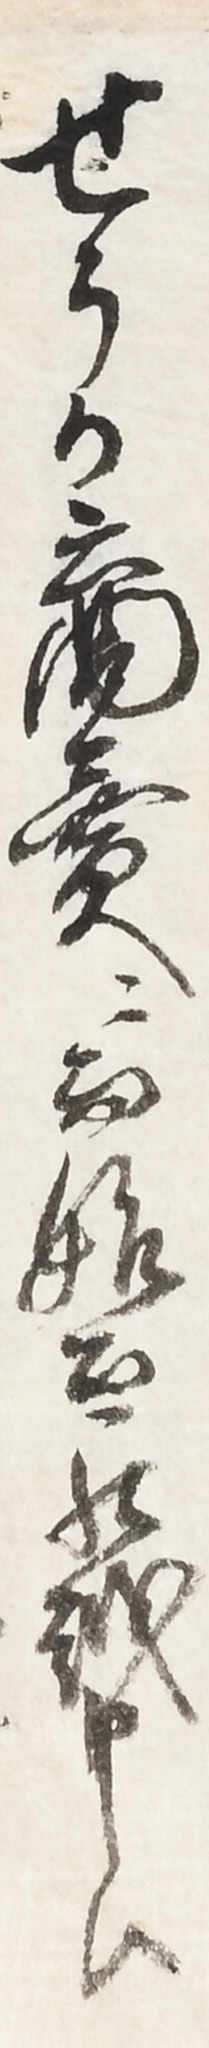せうか商売ニ而始而罷越申候
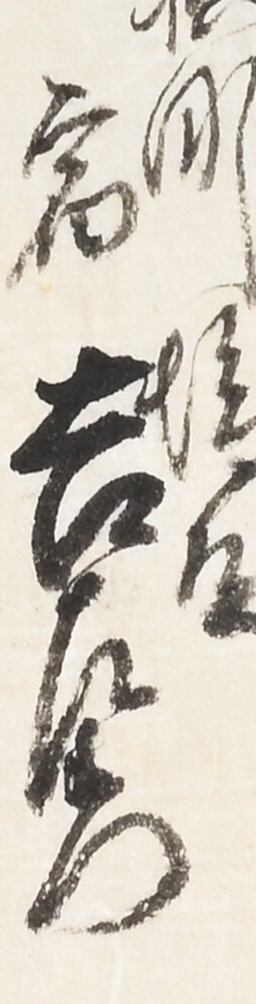宿吉左衛門
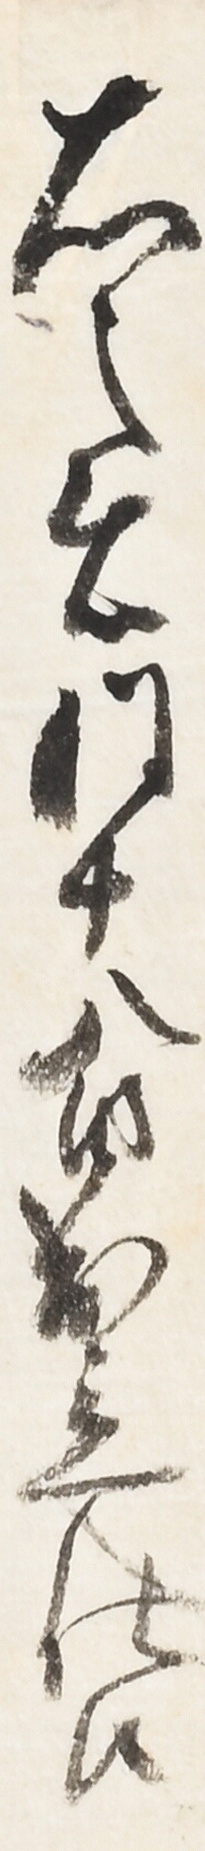右之者同十八日出立仕候
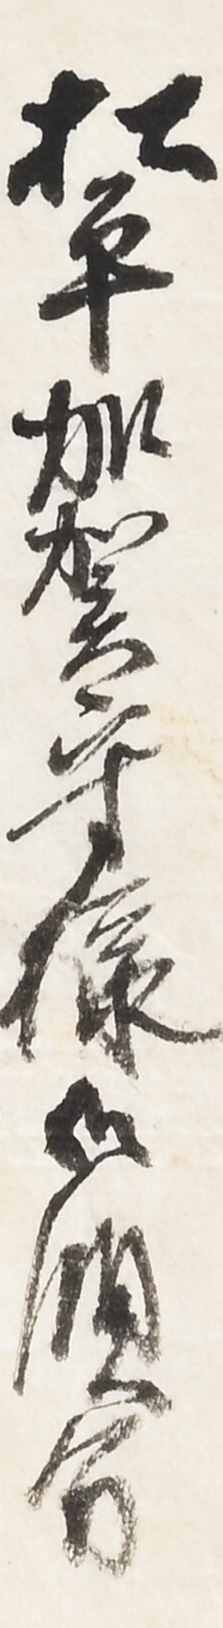松平加賀守様御領分
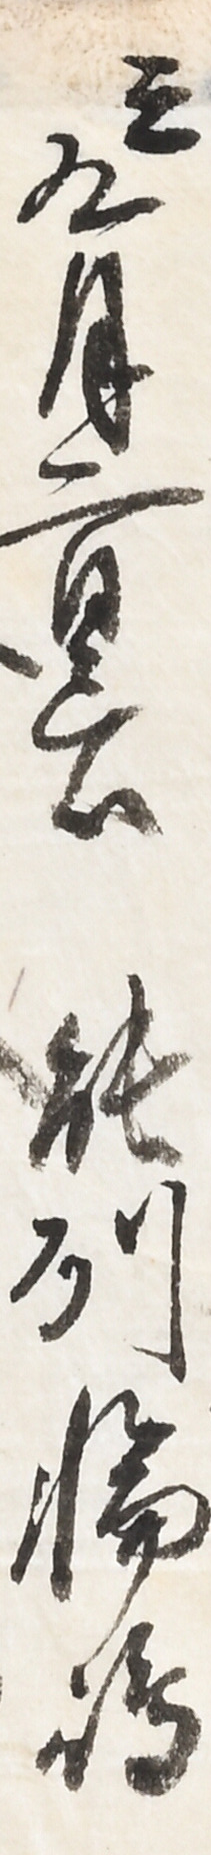閏九月二日着能州輪島
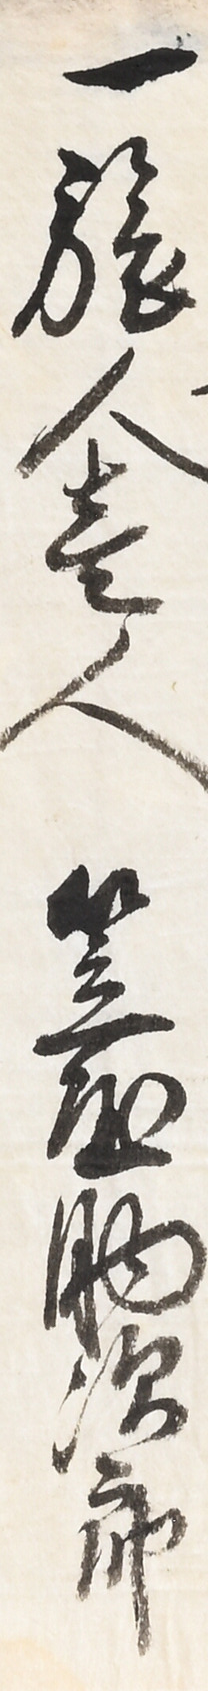一旅人壱人笠屋助次郎
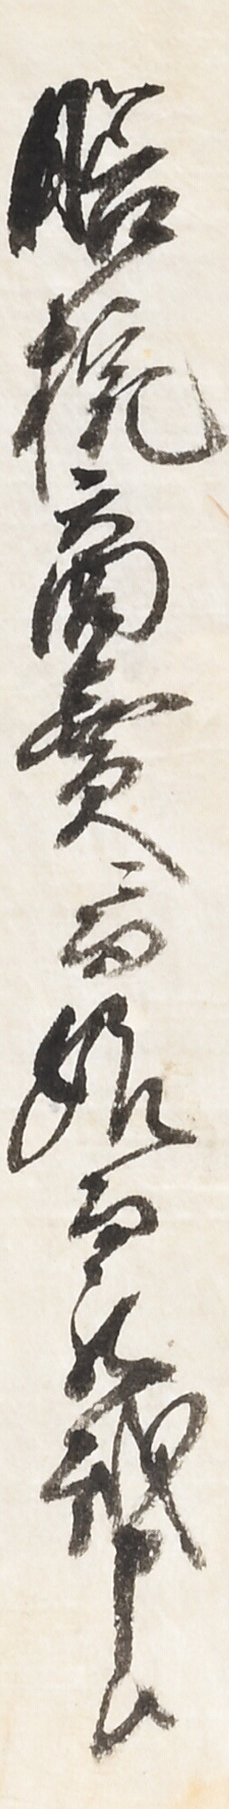膳椀商売ニ而始而罷越申候
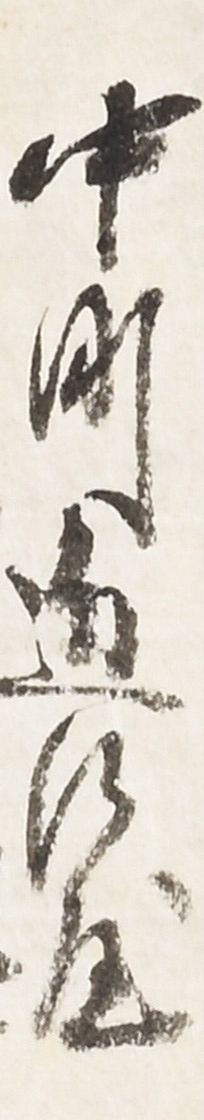中町近江屋
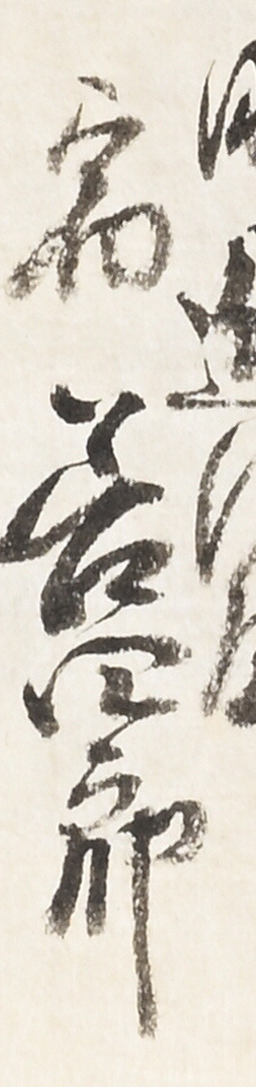宿善四郎
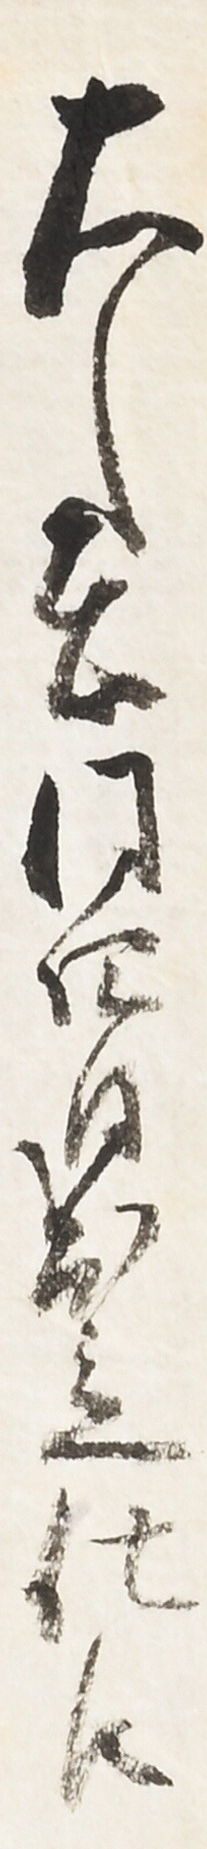右之者同四日出立仕候
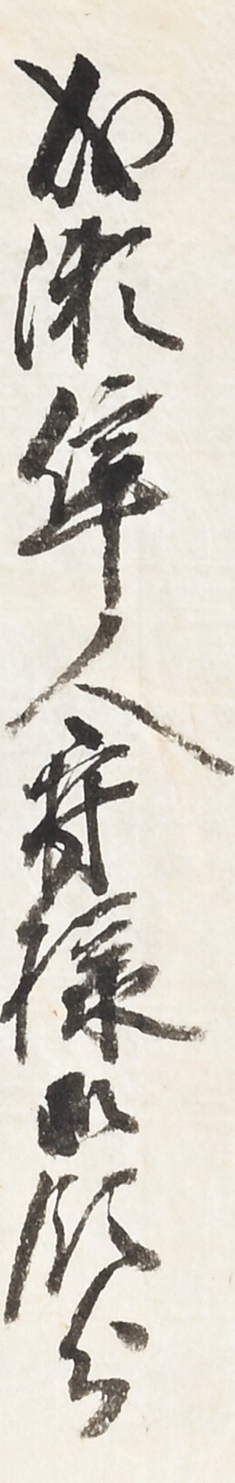成瀬隼人守様御領分
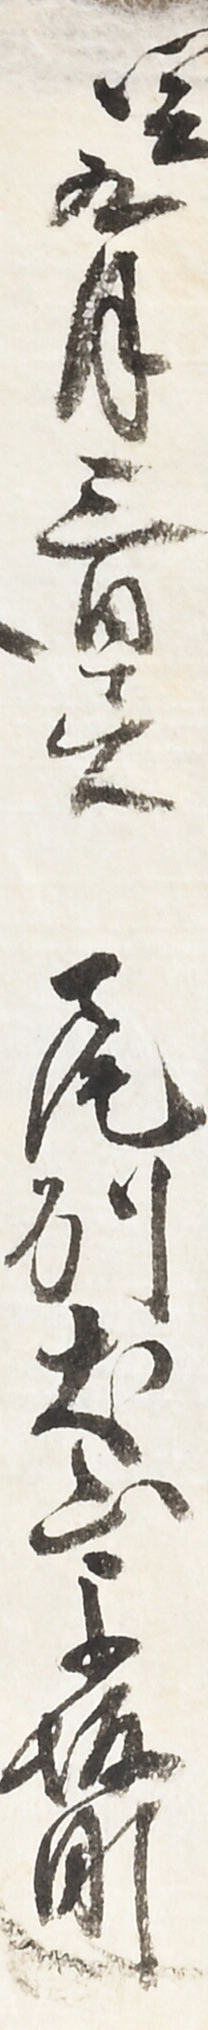閏九月三日着尾州犬山与坂町
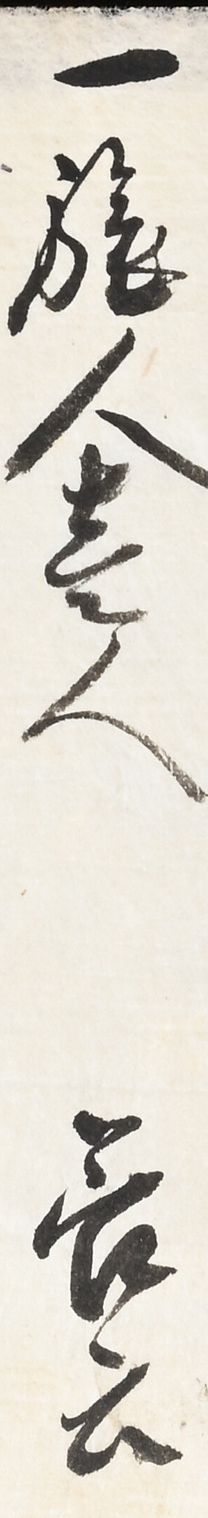一旅人壱人善六
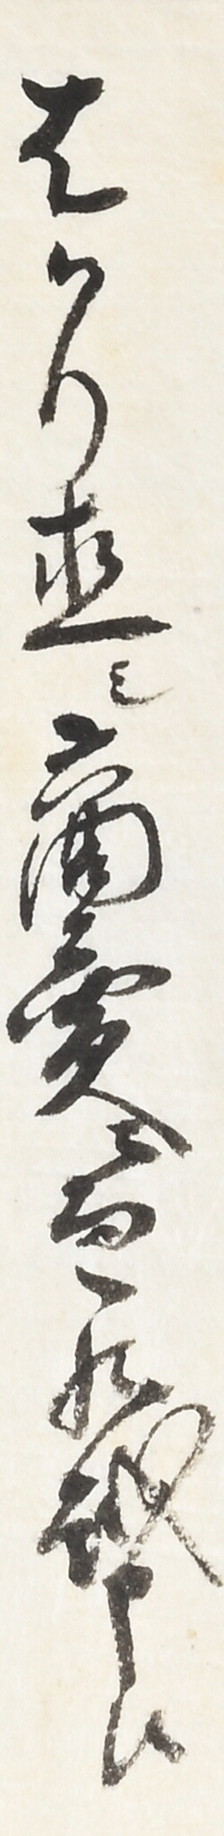はかり直シ商売ニ而罷越申候
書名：旅人泊控帳
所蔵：伊那市立高遠町図書館・合同会社AMANE
